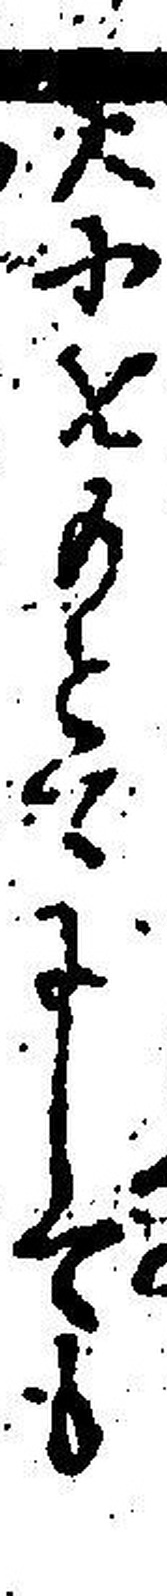大小をもとてにしても
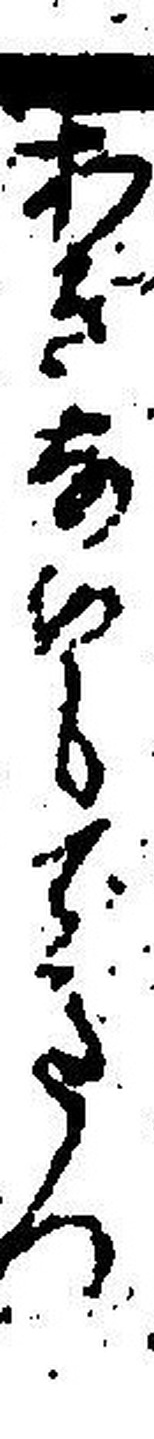あきないもできつ
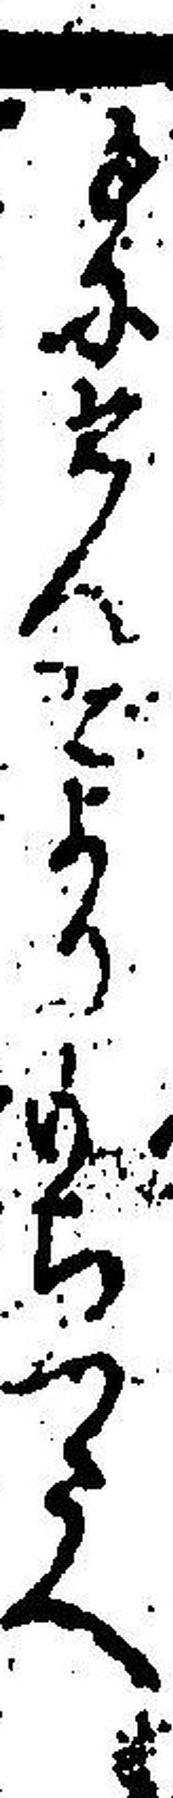事？に？せんぞよりもちつたへ
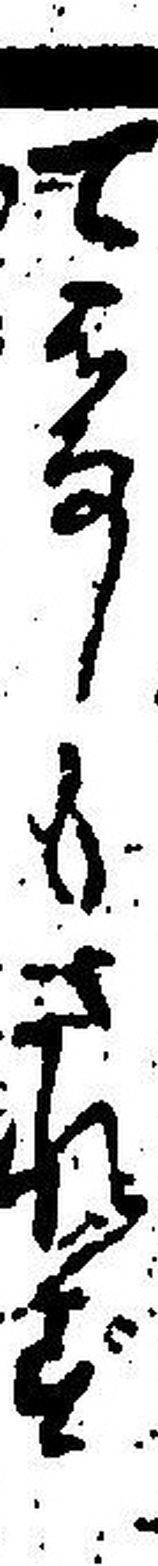てはなしもされず
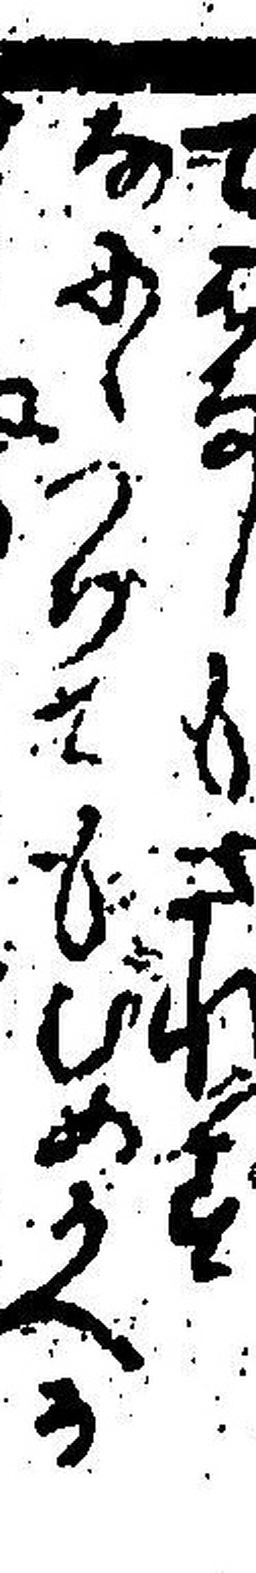なにゝつけてもむめかへか
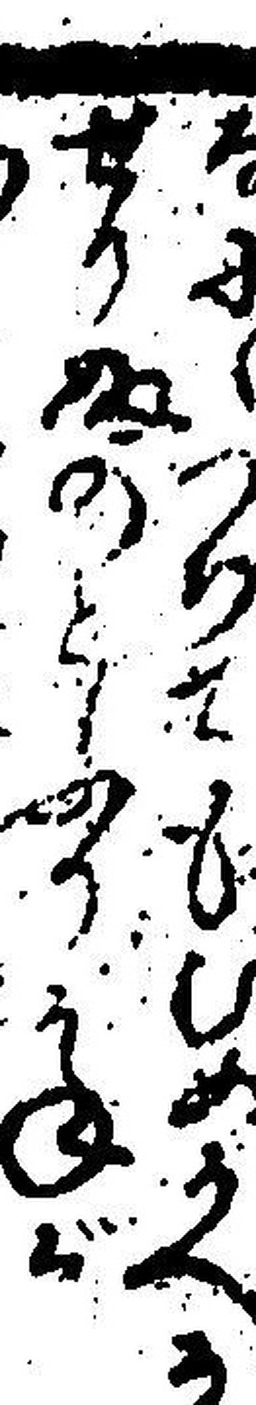せりふのとふりかねが
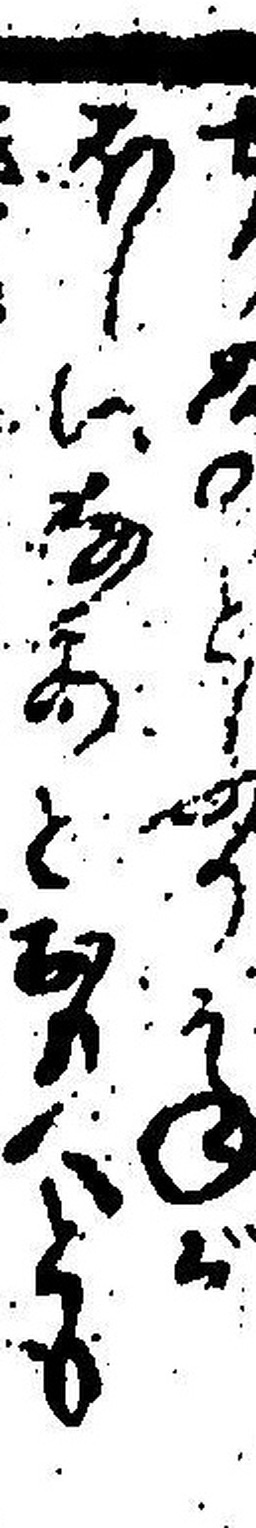ほしいなあとおもへとも
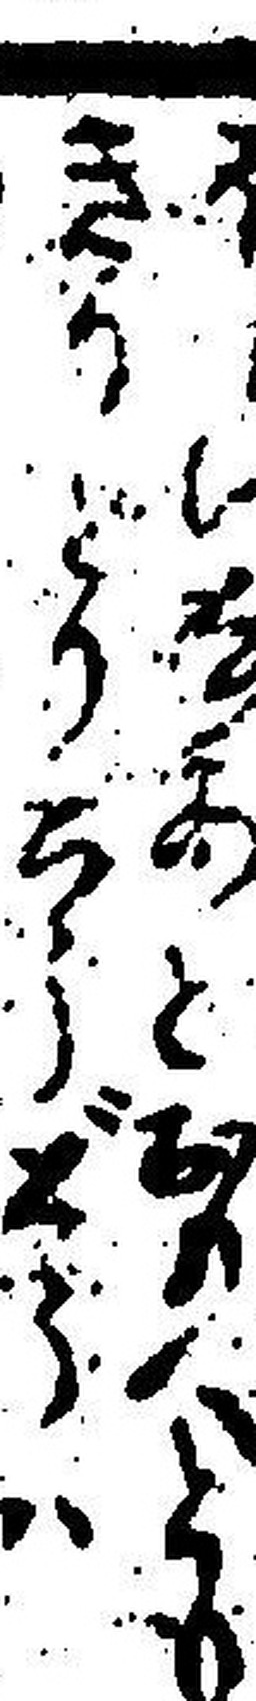きりどりこうどうは
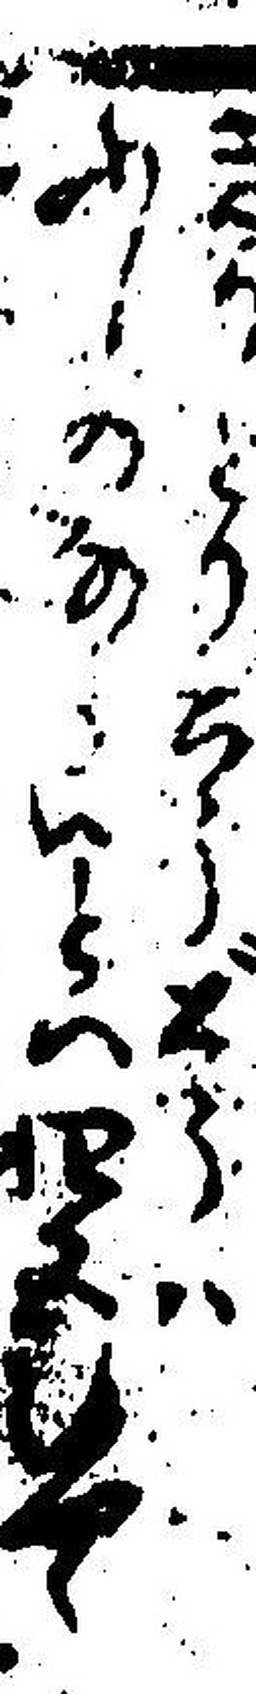ふしのならいとは四五ひやく
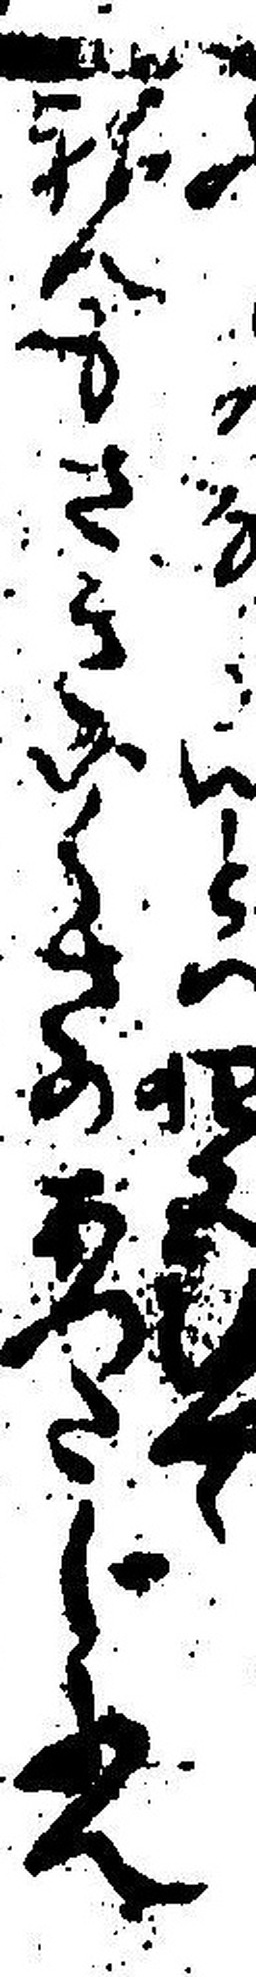ねんもさきいくさのあつたじふん
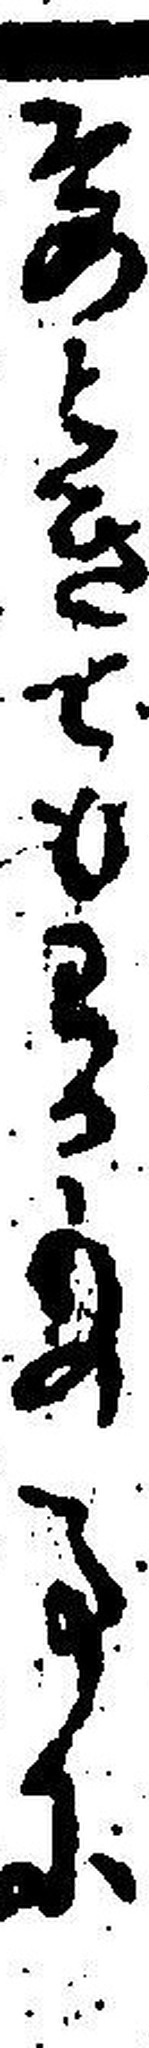そのときてもわかもの事に
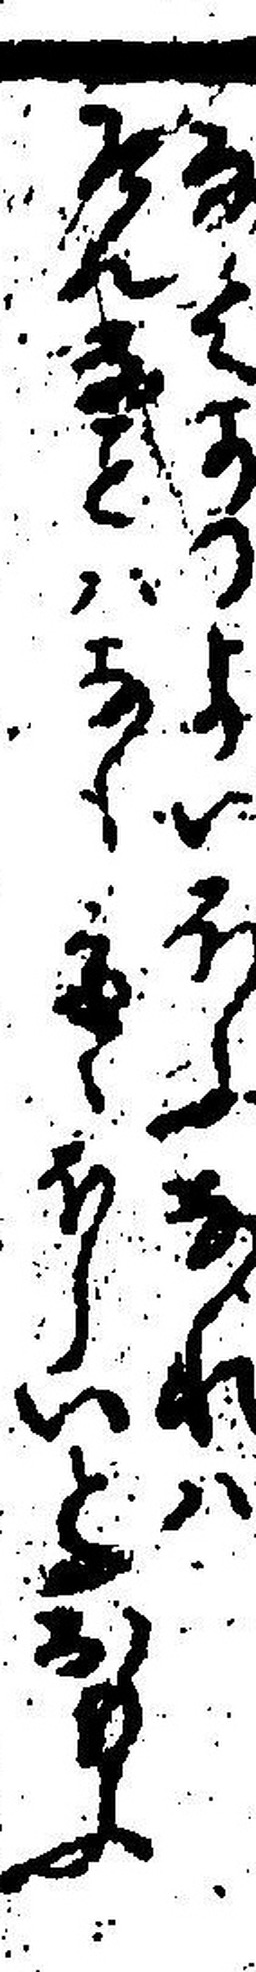そんなことはなくたゝほしいとおもふ

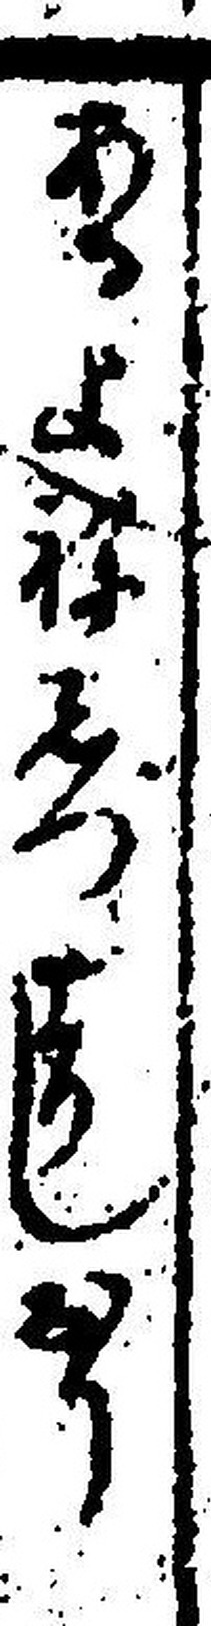あるよねしつまりしおり
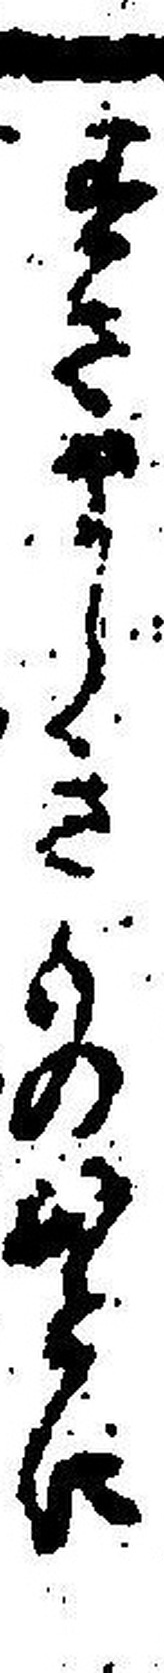すさましきものおとに
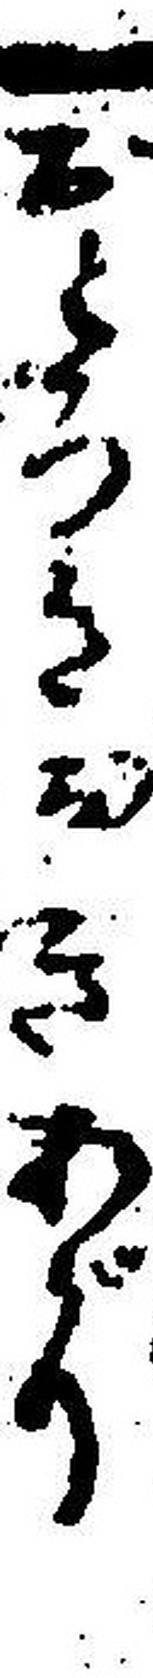おとろきおきあがり
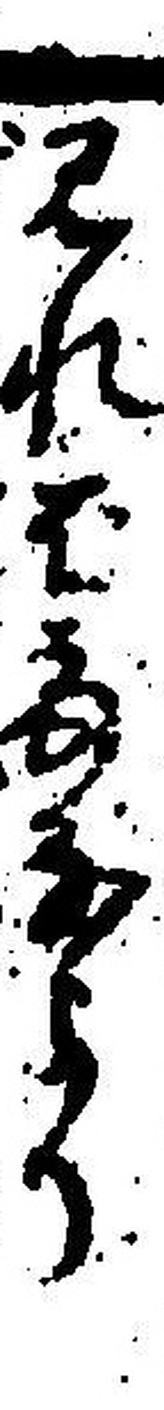みればたなより
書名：牡丹餅棚有 / 市場通笑作
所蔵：東京大学総合図書館 General Library in the University of Tokyo, JAPAN
